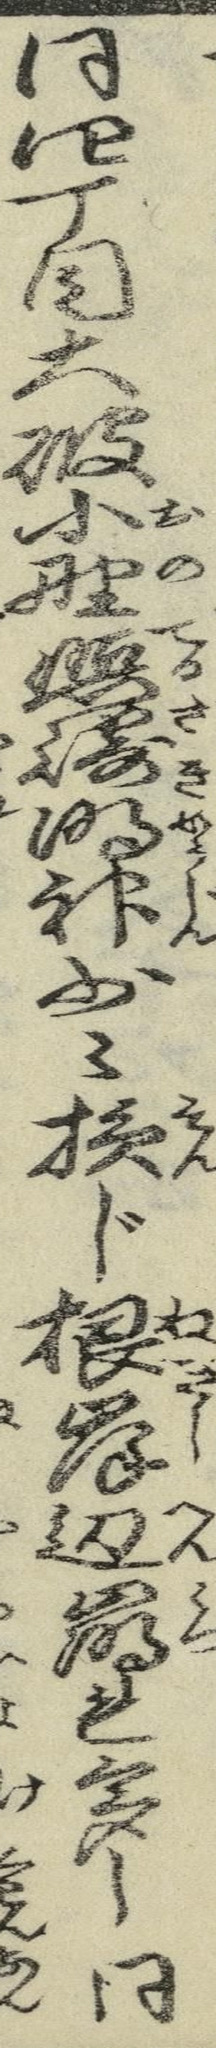同四丁目大破小野照崎明神少々損じ根岸辺崩れ多し同
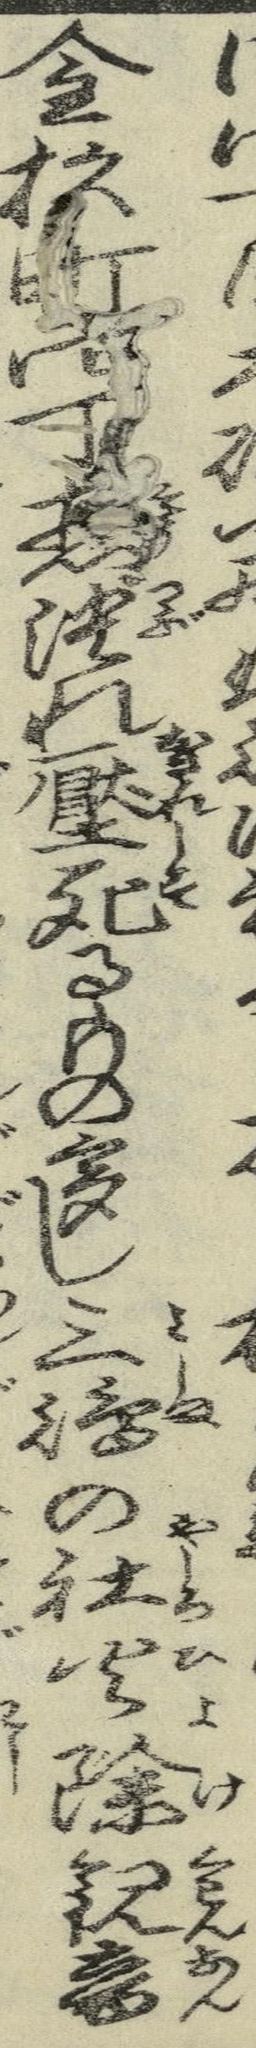金杉町四丁惣潰れ圧死るもの多し三嶋の社火除観音
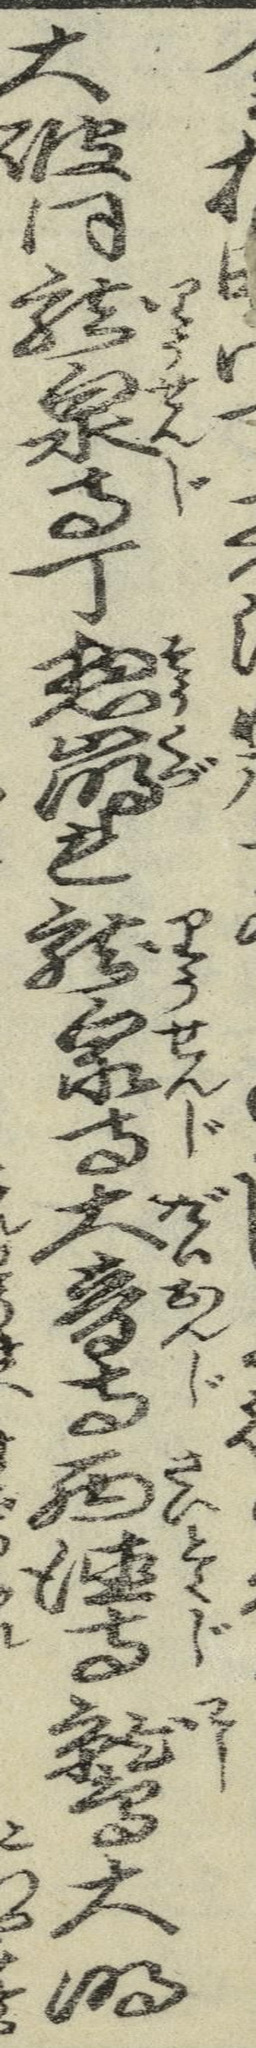大破同龍泉寺丁惣崩れ龍泉寺大音寺西徳寺鷲大明
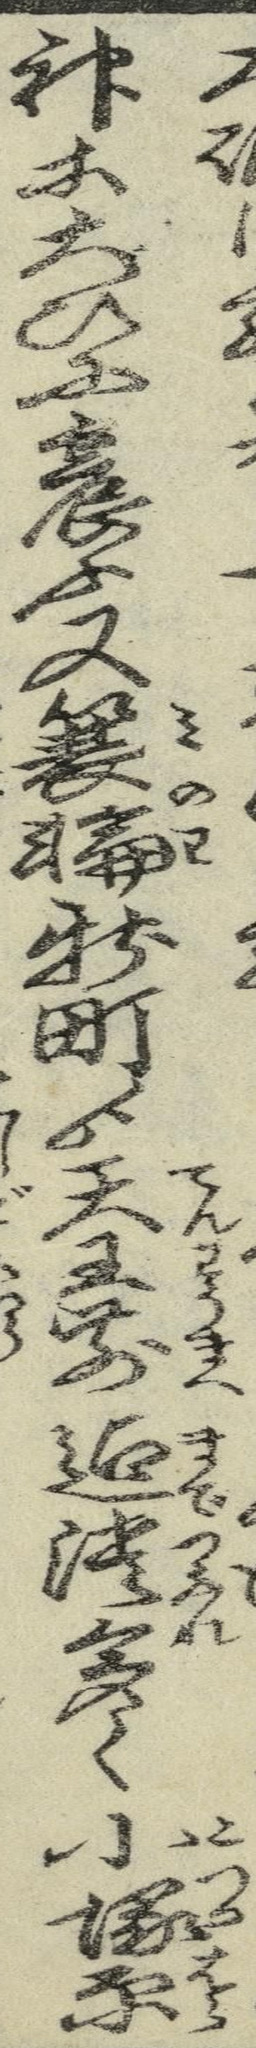神等大ひに震ふ又蓑輪新町ゟ天王前迄潰多く小塚原
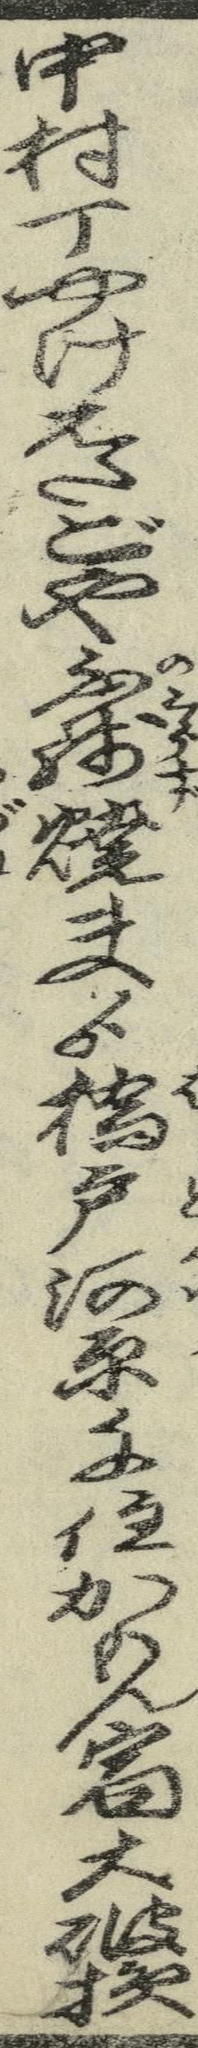中村丁やけはたごや不残焼夫ゟ橋戸河原千住かもん宿大破損
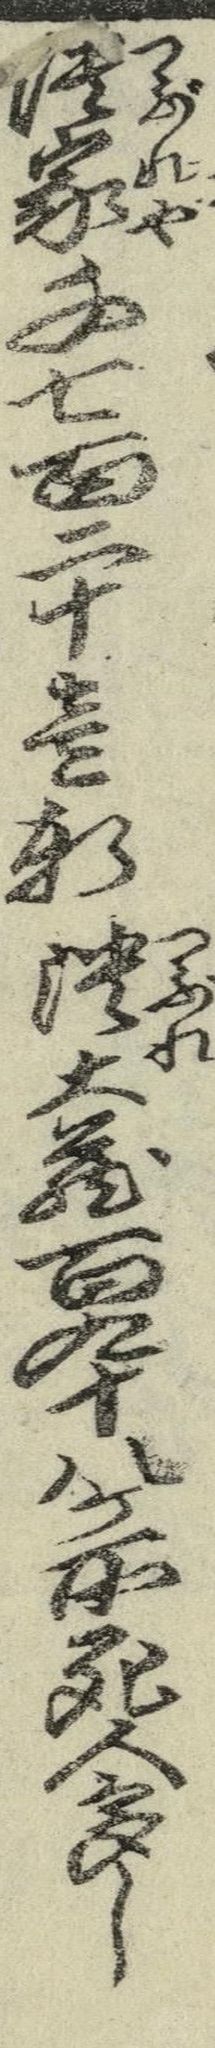潰家千七百二十壱軒潰土蔵百九十八ケ所死人多し
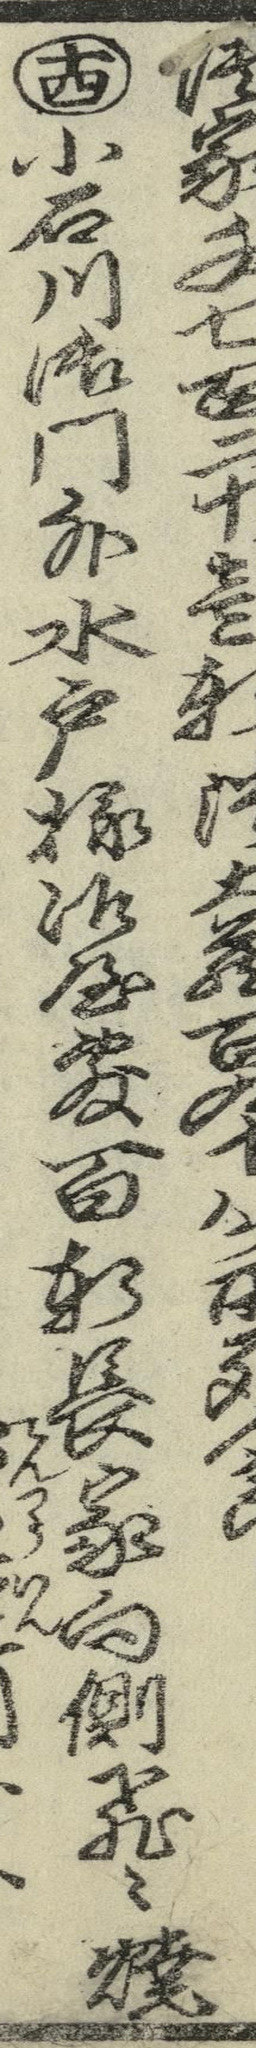十四小石川御門外水戸様御屋敷百軒長屋向側飛々焼
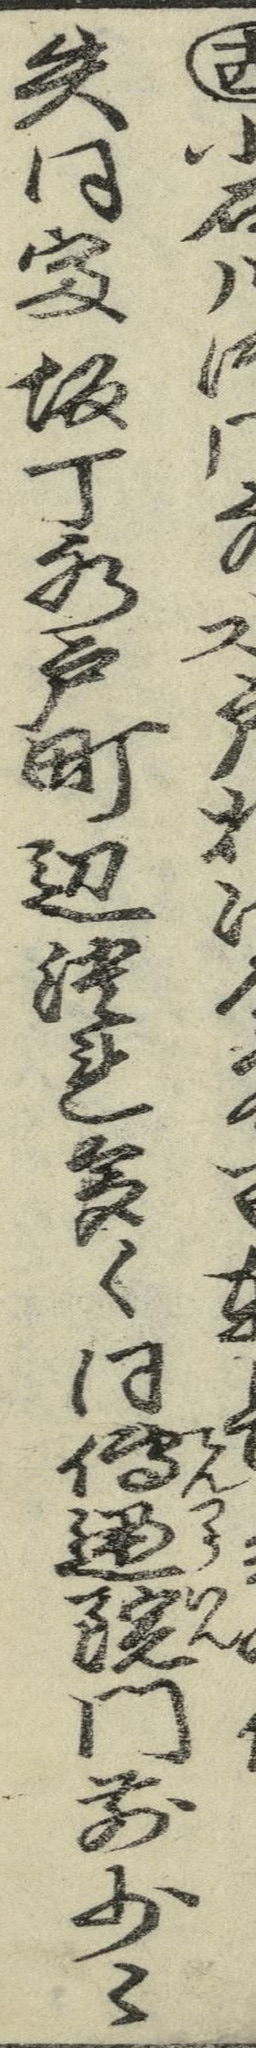失同芨坂丁水戸町辺潰れ多く同伝通院門前少々
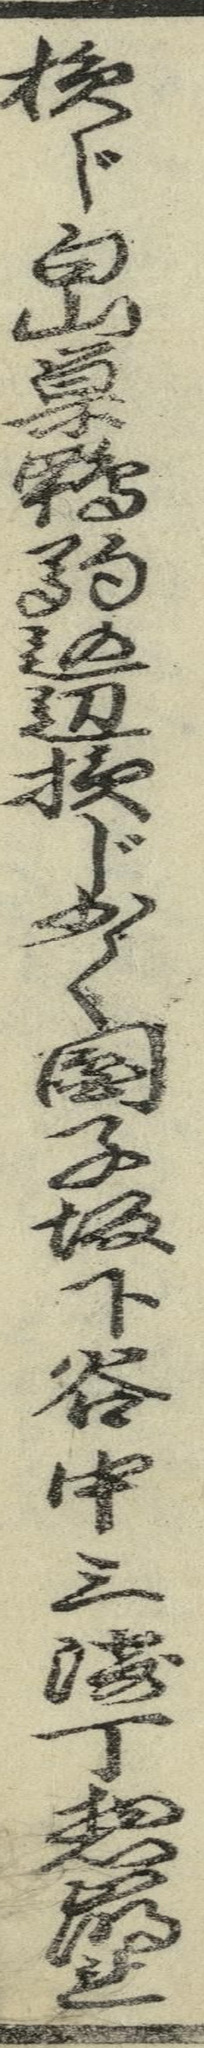損じ白山巣鴨駒込辺損じ少々団子坂下谷中三崎丁惣崩れ

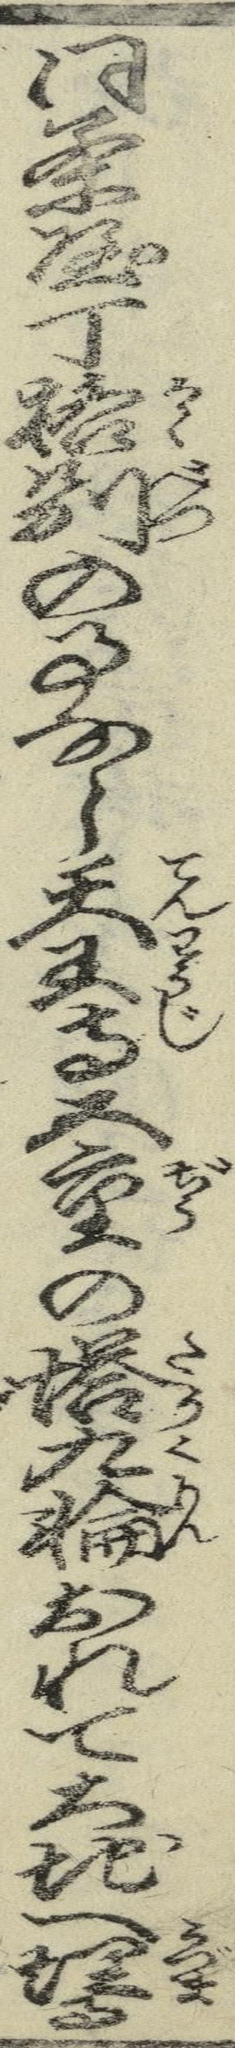同茶屋丁格別の事なし天王寺五重の塔九輪おれて大地へ埋る
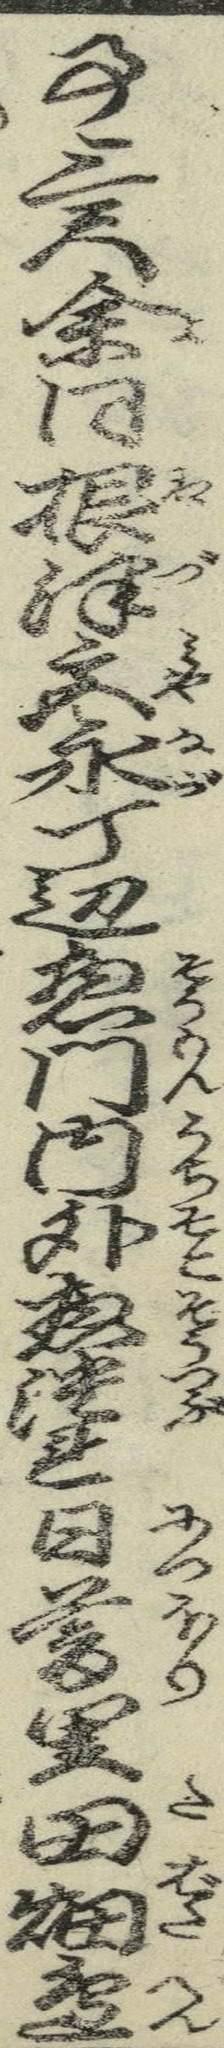事三尺余同根津宮永丁辺惣門内外惣潰れ日暮里田畑辺
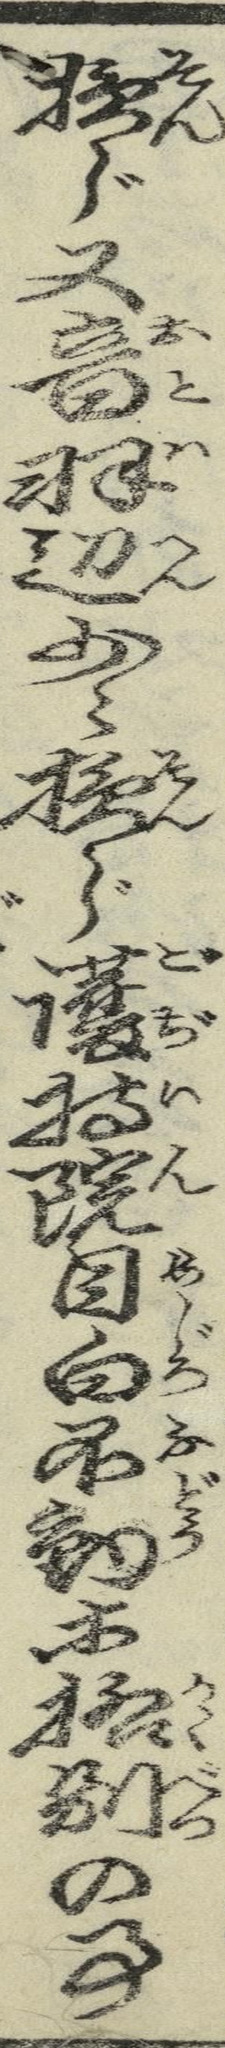損じ又音羽辺少々損じ護地院目白不動等格別の事
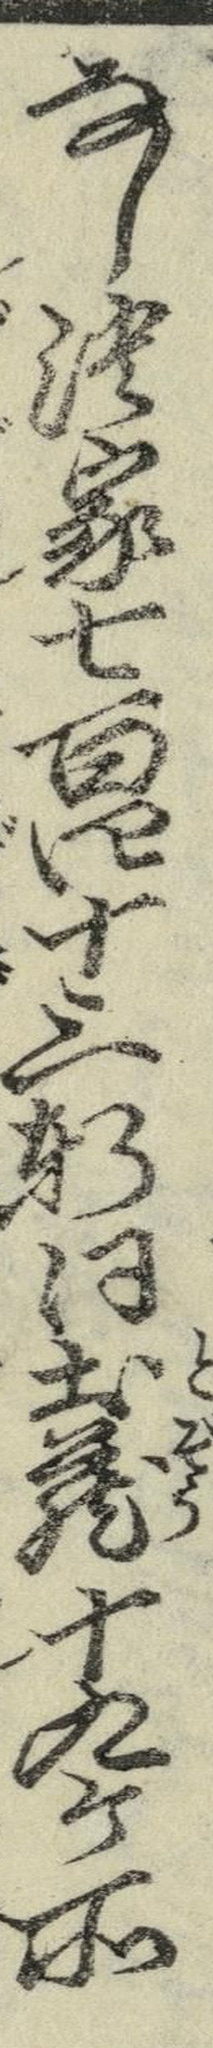なし潰家七百四十三軒同土蔵十九ケ所
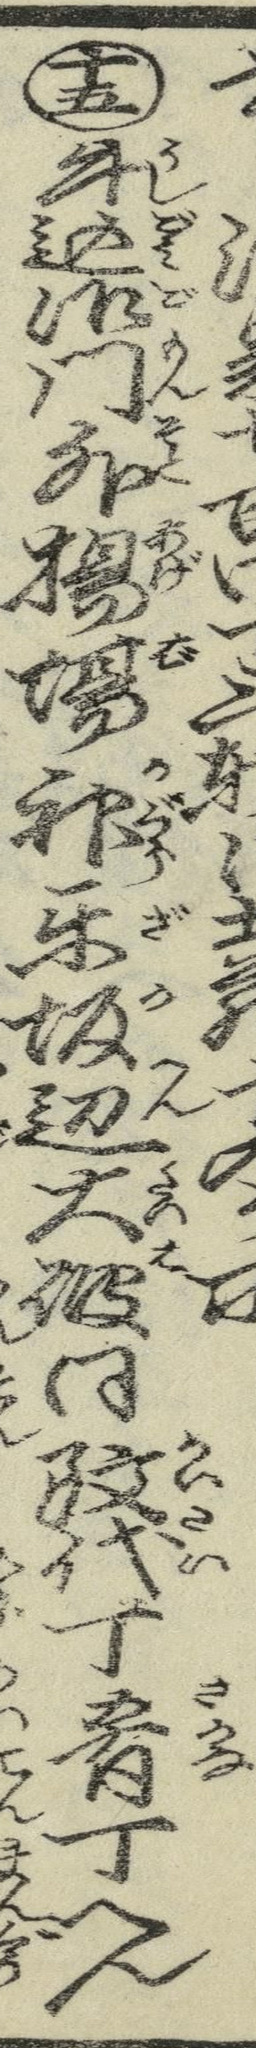十五牛込御門外揚場神楽坂辺大破同改代丁肴丁へん
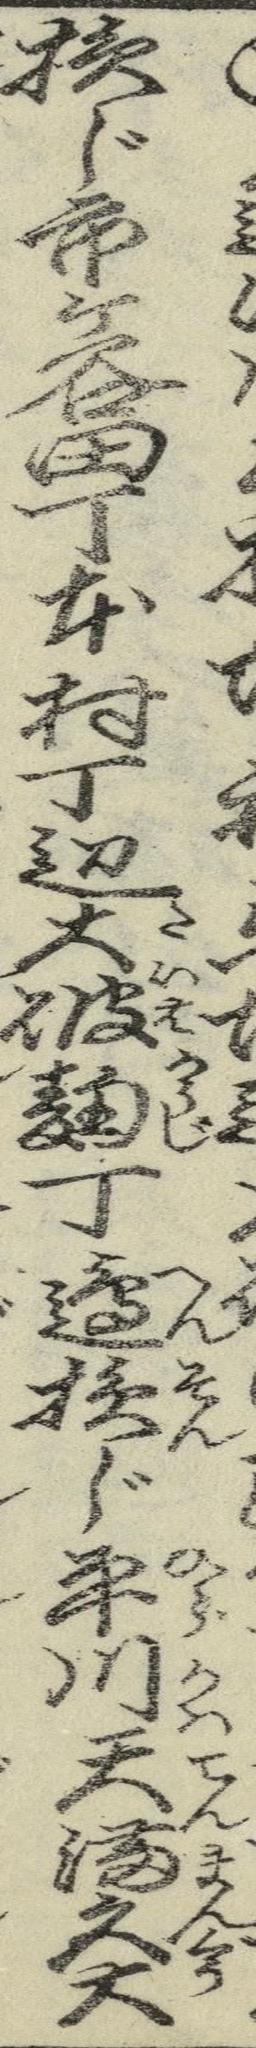損じ市ケ谷田丁本村丁辺大破麹丁辺損じ平川天満宮大
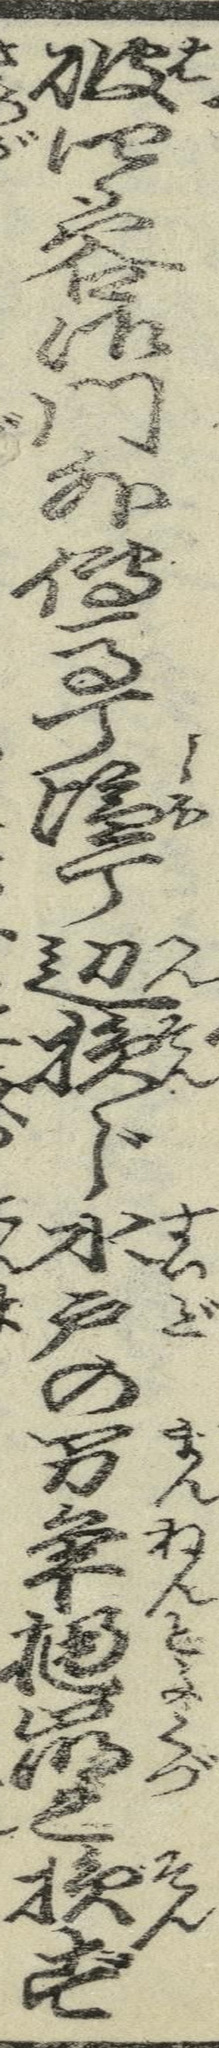破四ツ谷御門外伝馬丁塩丁辺損じ水戸の万年樋崩れ損ず
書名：地震年代記
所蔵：東京大学地震研究所図書室 Earthquake Research Institute Library, The University of Tokyo, JAPAN
